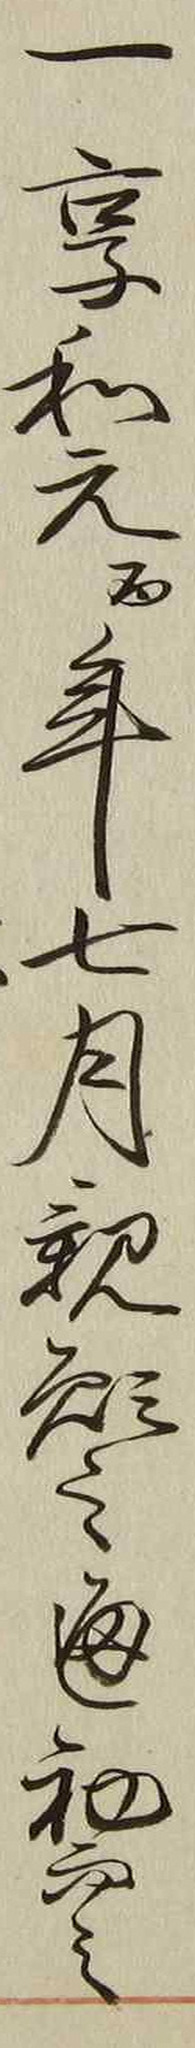一享和元酉年七月親願之通初而之
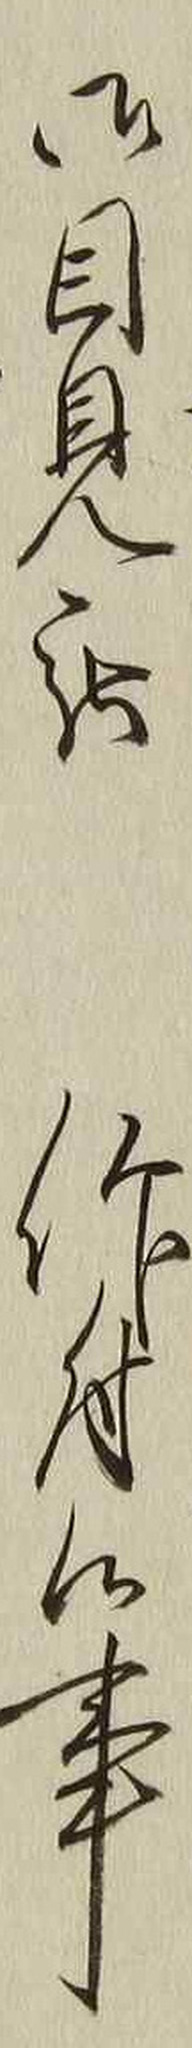御目見被お仰付候事
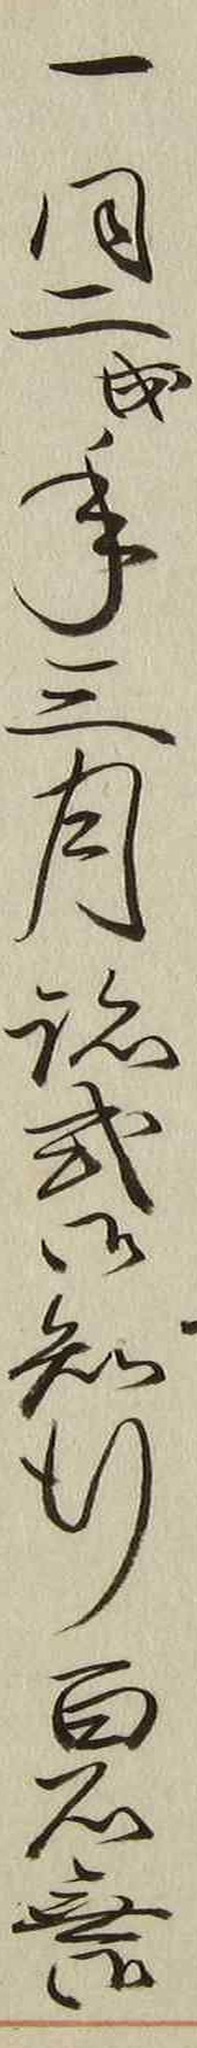一同二申年三月跡式御知行百石無御
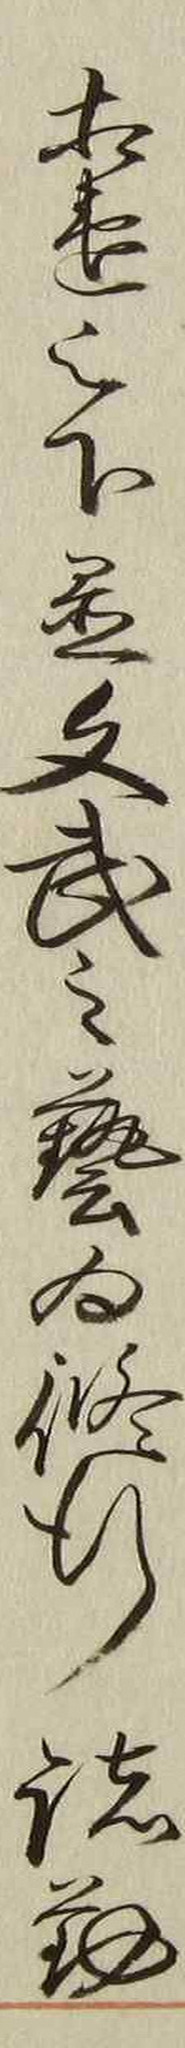相違被下置文武之芸為修行書諸勤
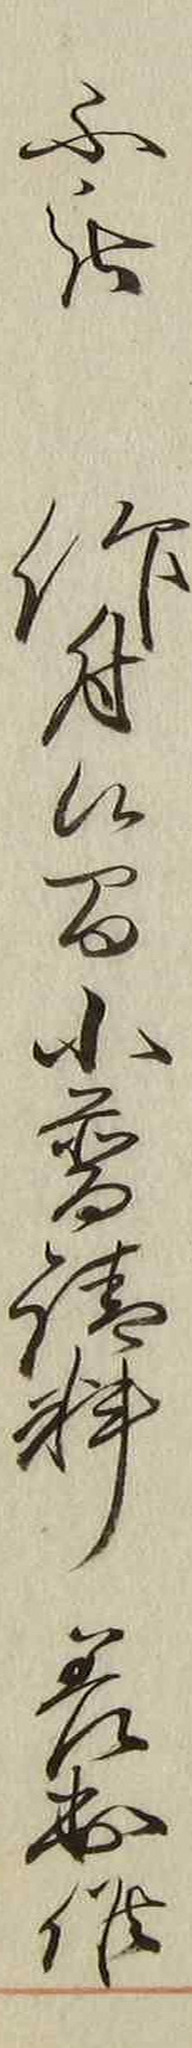不被仰付候間小普請料差出候
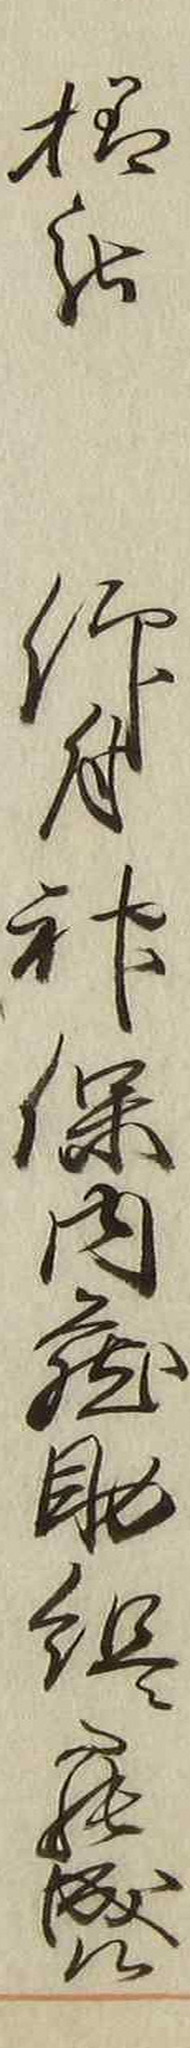様被仰付神保内蔵助組ニ罷成候
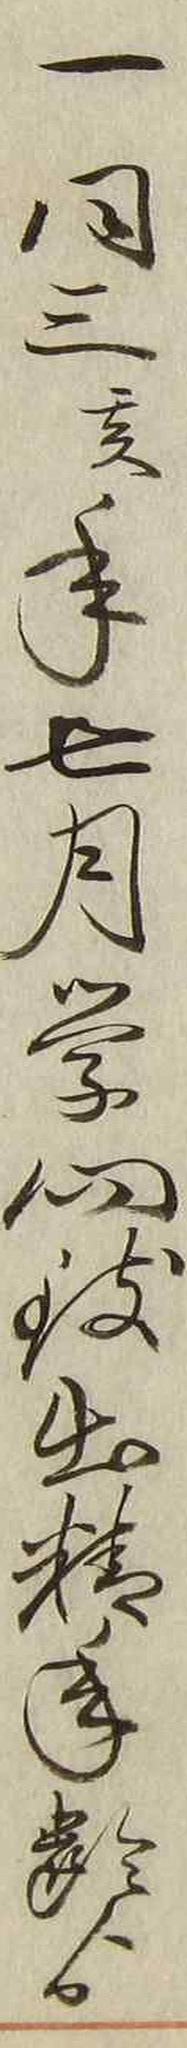一同三亥年七月学問致出精年齢ゟ
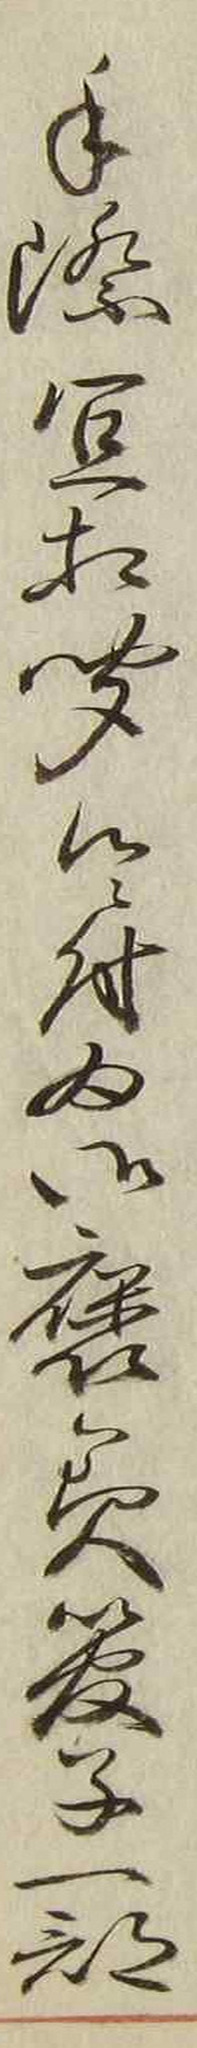手際宜相聞候ニ付為御褒美韓子一部
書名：諸士系譜　巻之54　ほ之部1
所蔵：会津若松市立会津図書館
